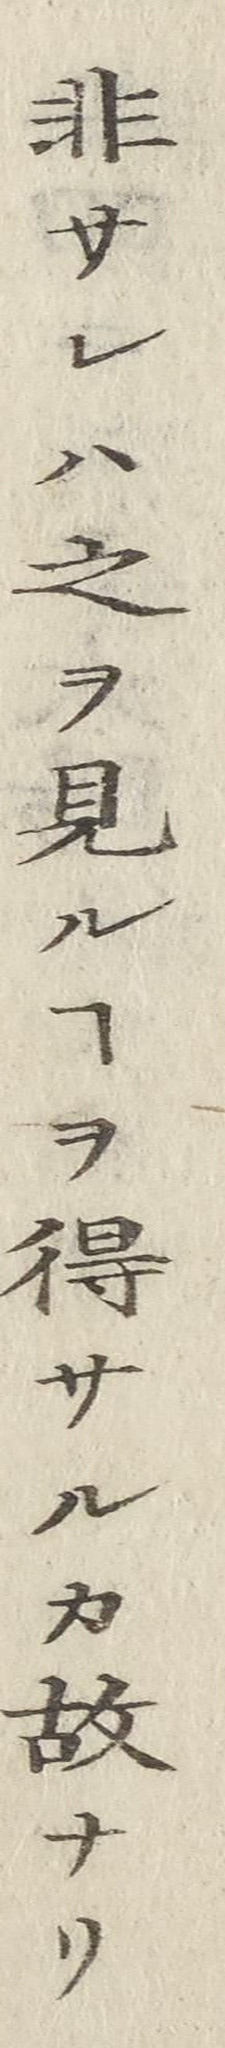非サレハ之ヲ見ルコトヲ得サルカ故ナリ
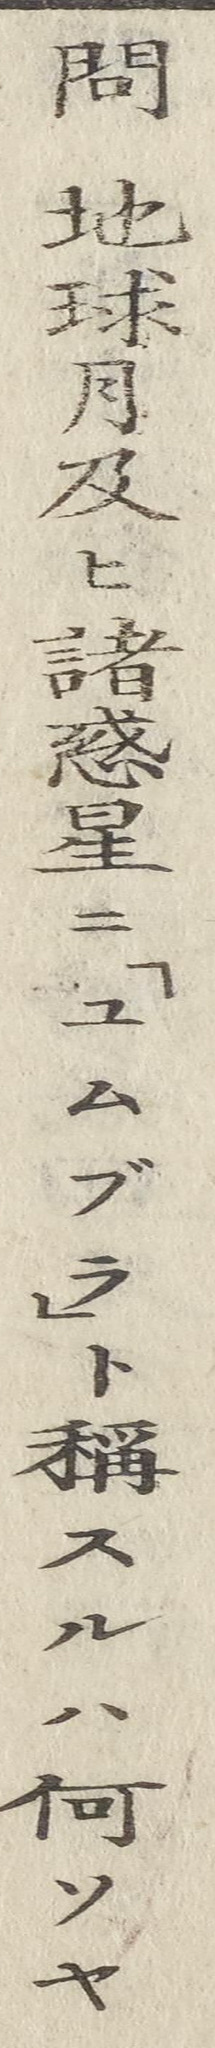問地球月及ヒ諸惑星ニ「ユムブラ」ト称スルハ何ソヤ
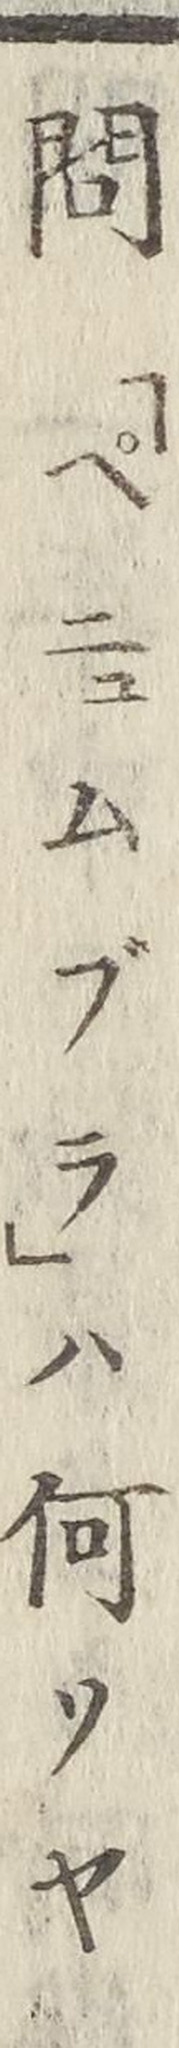問「ペニュムブラ」ハ何ソヤ
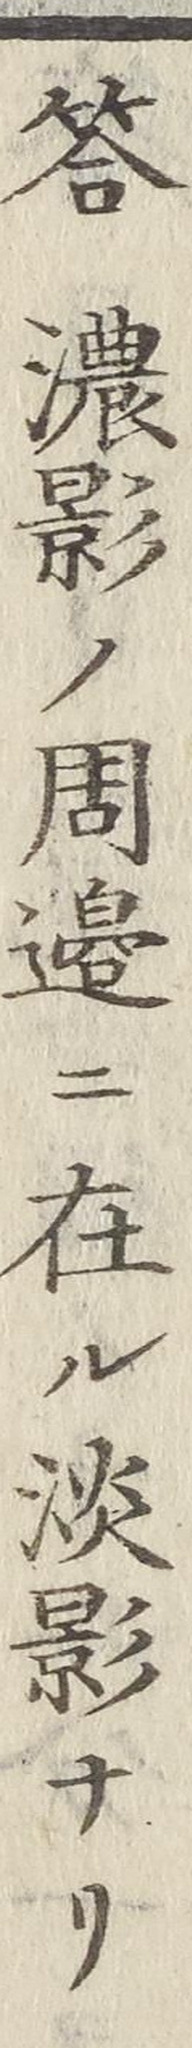答濃影ノ周辺ニ在ル淡影ナリ
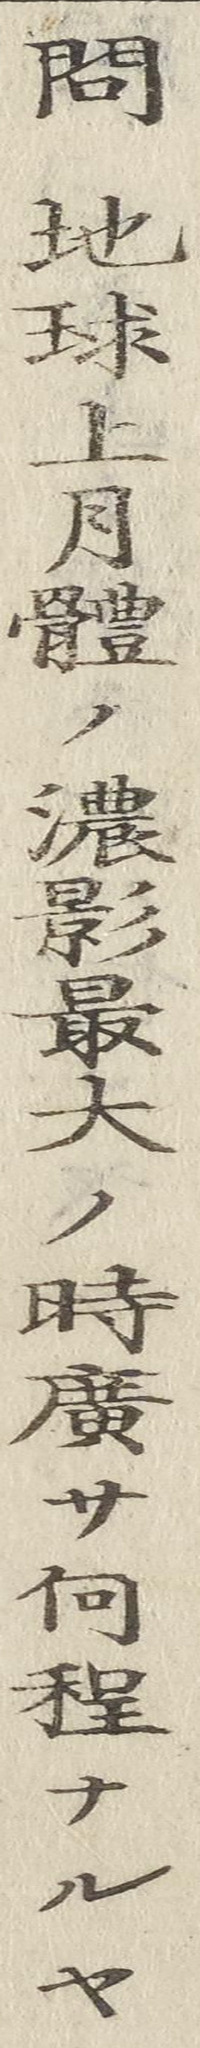問地球上月体ノ濃影最大ノ時広サ何程ナルヤ
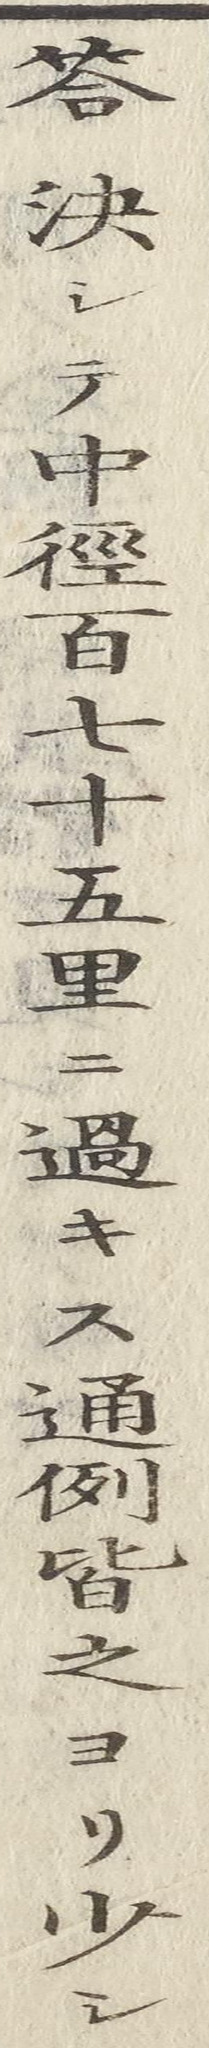答決シテ中径百七十五里ニ過キス通例皆之ヨリ少シ
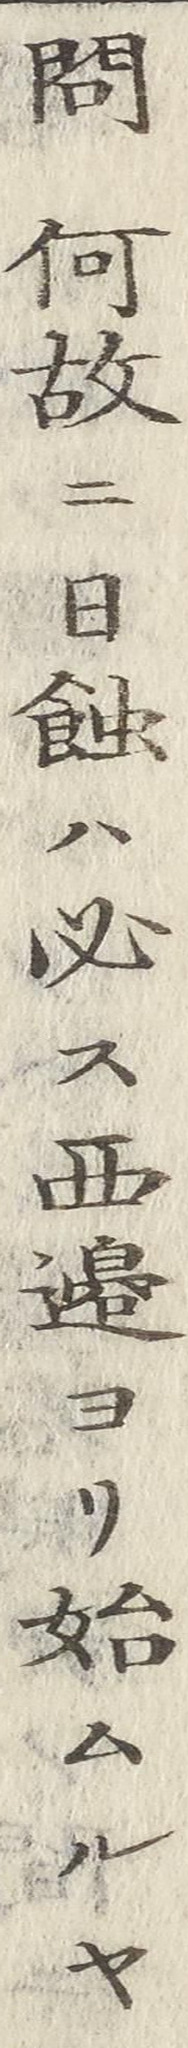問何故ニ日蝕ハ必ス西辺ヨリ始ムルヤ
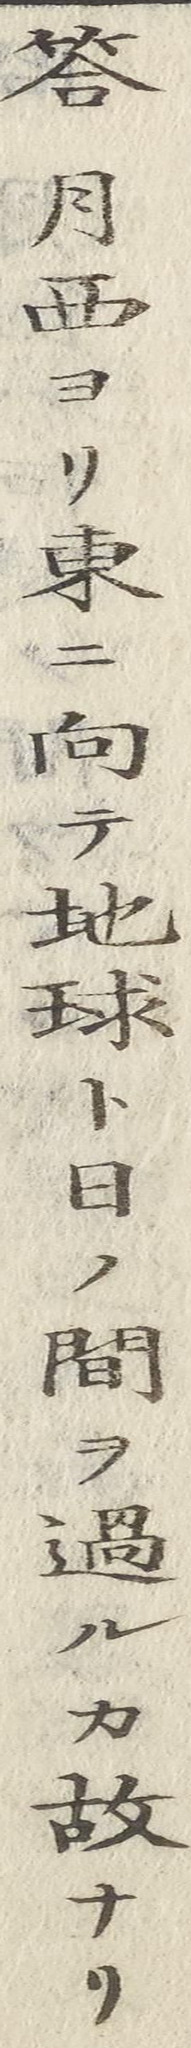答月西ヨリ東ニ向テ地球ト日ノ間ヲ過ルカ故ナリ
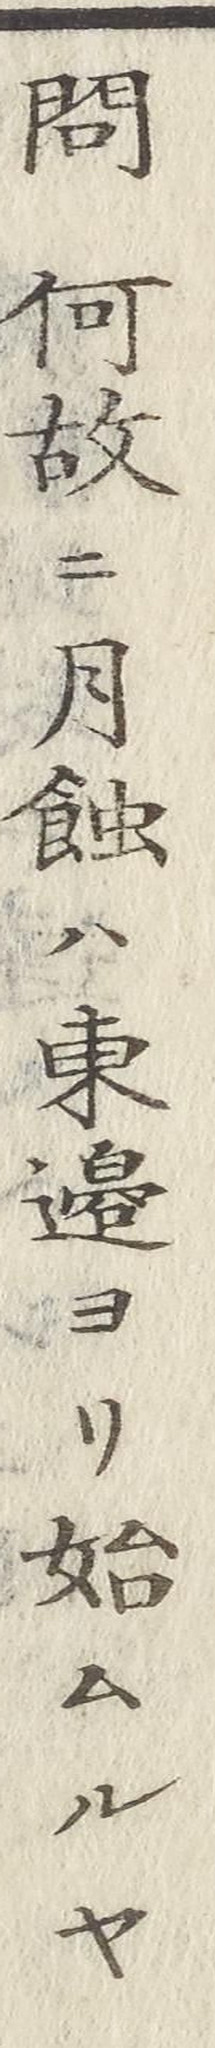問何故ニ月蝕ハ東辺ヨリ始ムルヤ
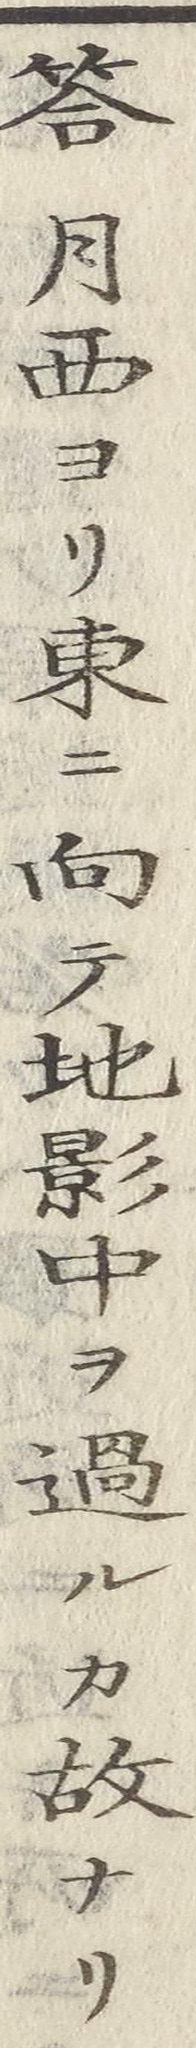答月西ヨリ東ニ向テ地影中ヲ過ルカ故ナリ
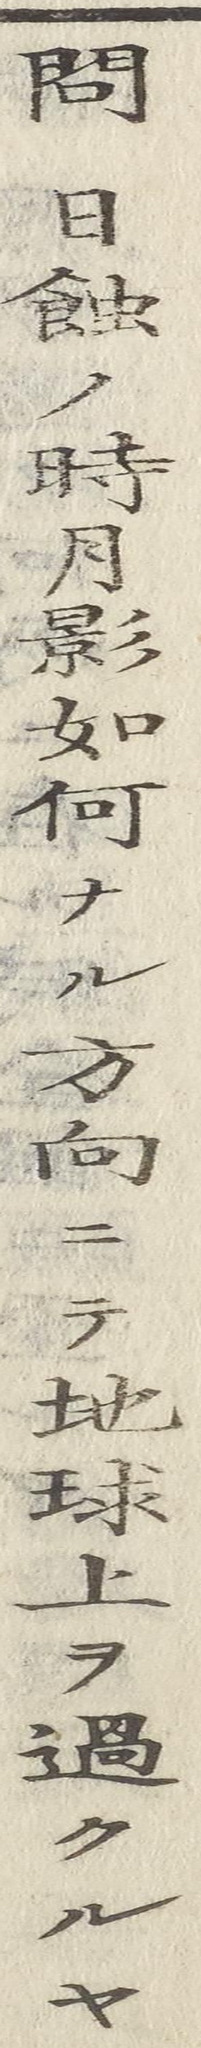問日蝕ノ時月影如何ナル方向ニテ地球上ヲ過クルヤ
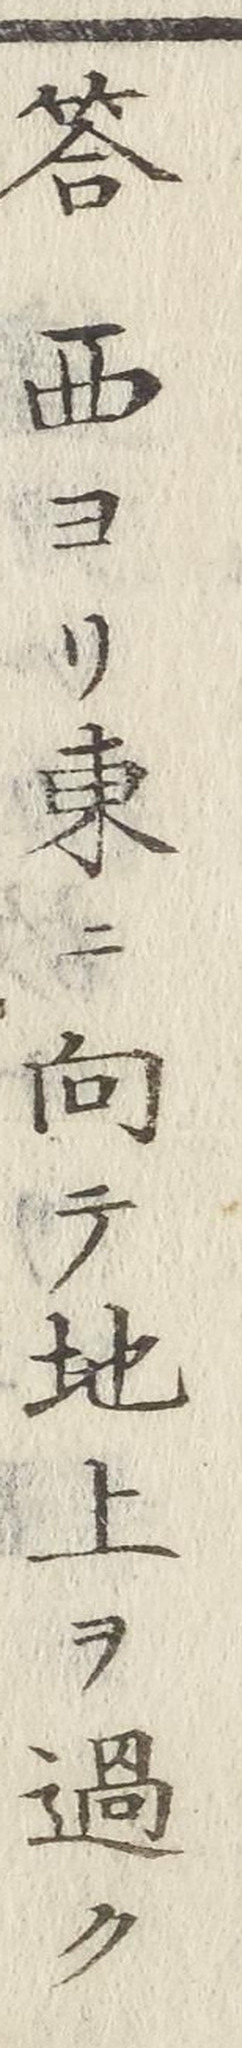答西ヨリ東ニ向テ地上ヲ過ク
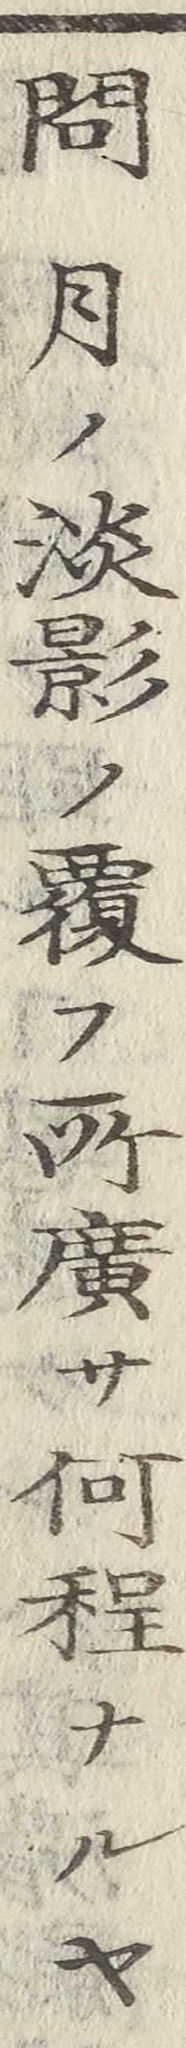問月ノ淡影ノ覆フ所広サ何程ナルヤ
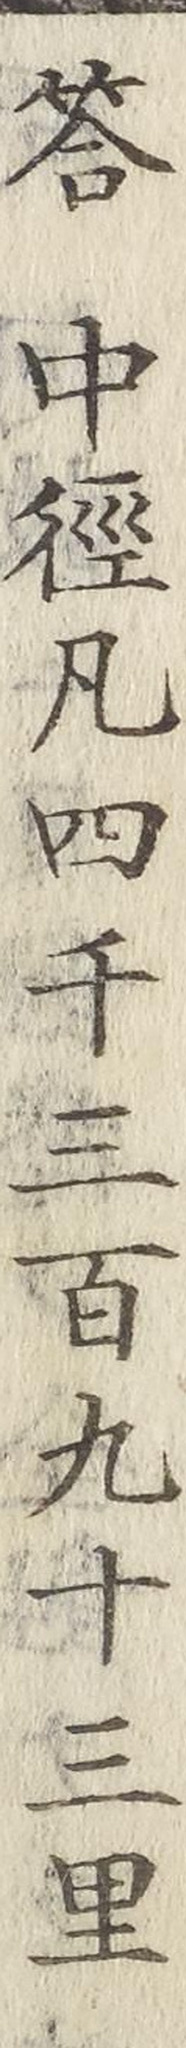答中径凡四千三百九十三里

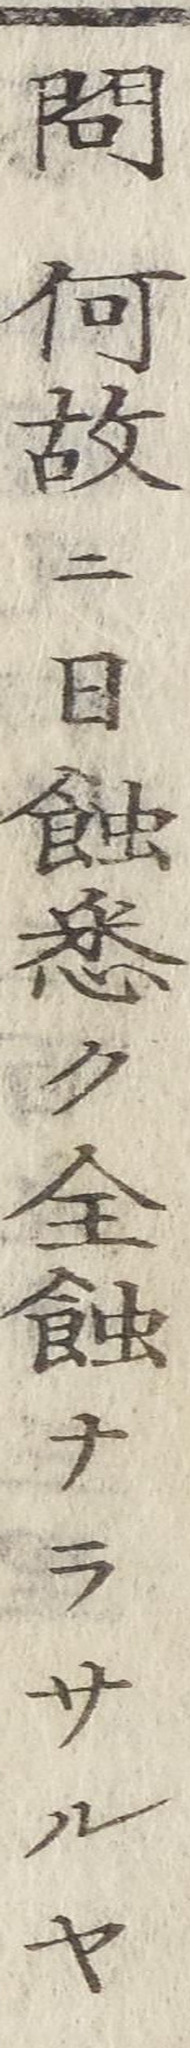問何故ニ日蝕悉ク全蝕ナラサルヤ
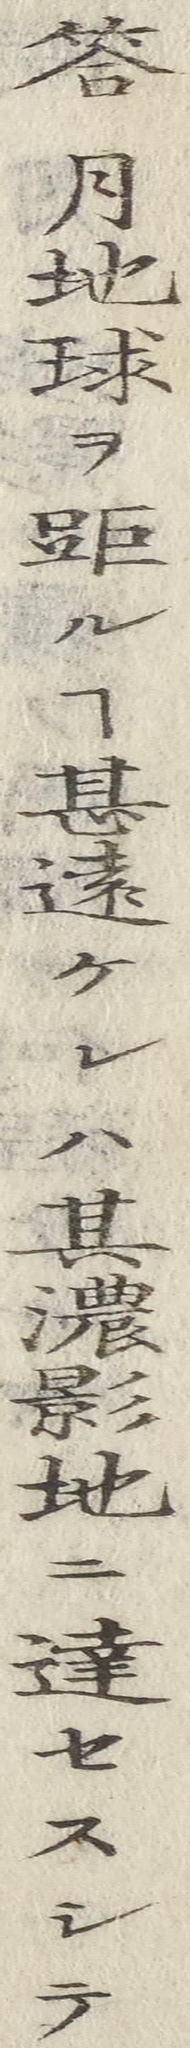答月地球ヲ距ルコト甚遠ケレハ其濃影地ニ達セスシテ
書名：星学圖説　下
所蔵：東京大学地震研究所図書室 Earthquake Research Institute Library, The University of Tokyo, JAPAN
